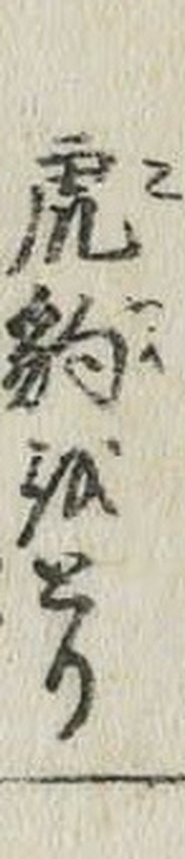虎豹をとり
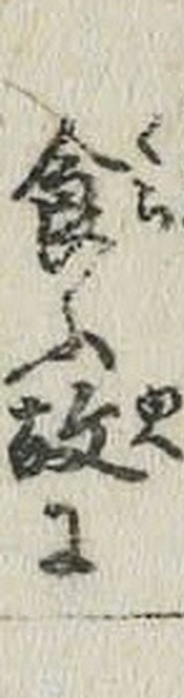食う故に
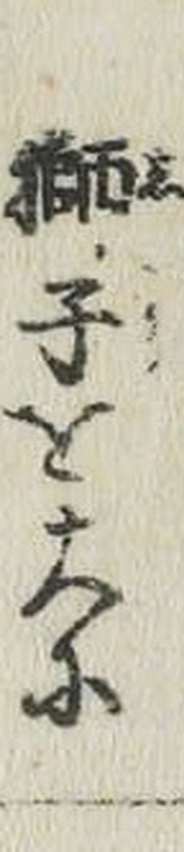獅子を大に
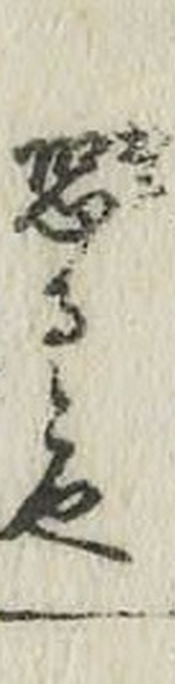恐るとや
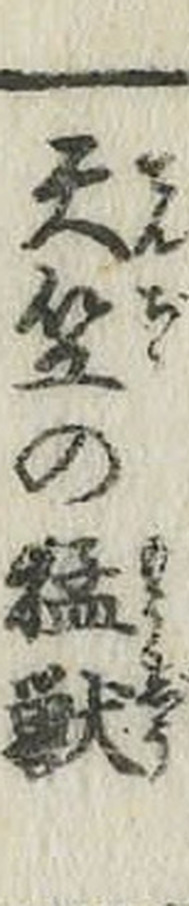天竺の猛獣
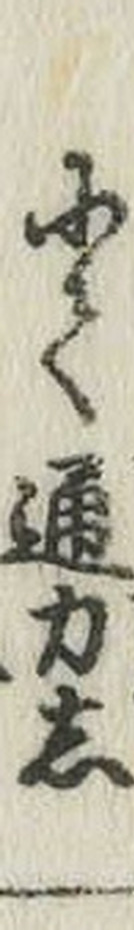にて通力し
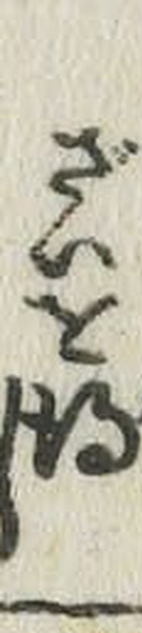ざいを得し
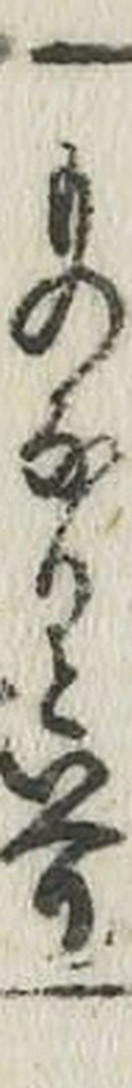ものなりといへり
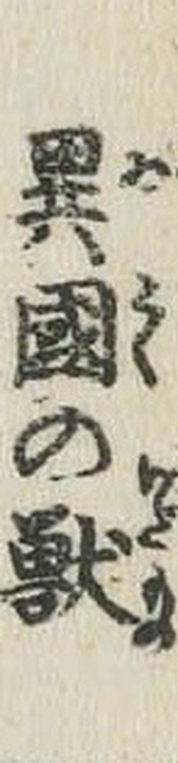異国の獣
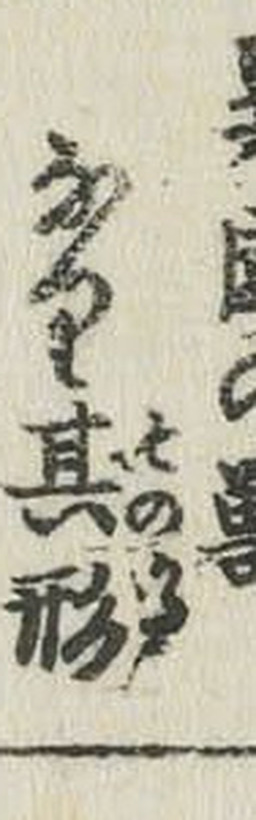なり其形
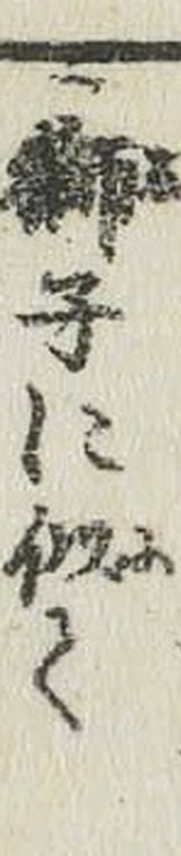獅子に似て
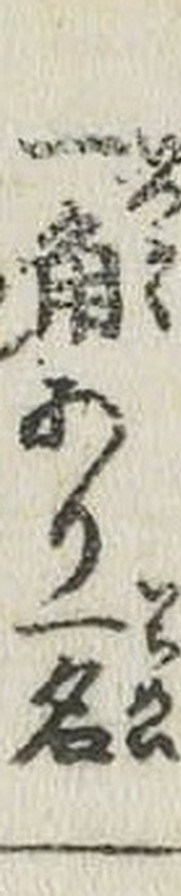一角あり一名
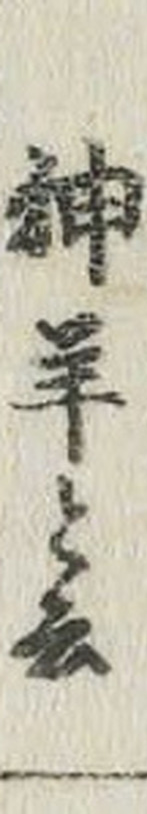神羊と云
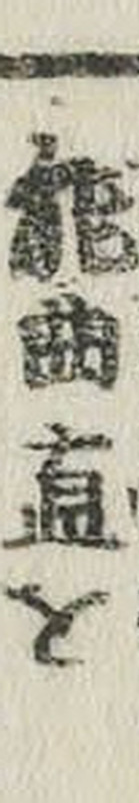能曲直を
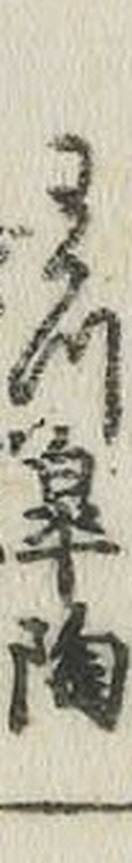わかつ皐陶
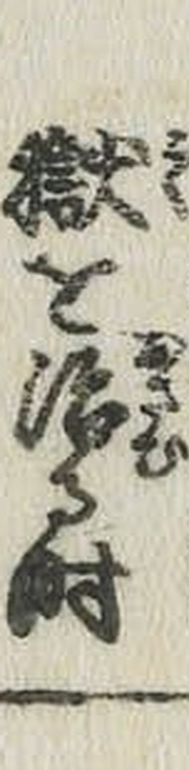獄を治る時
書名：増補頭書訓蒙図彙大成 10巻 6:巻之12-13
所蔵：東京学芸大学教育コンテンツアーカイブ
